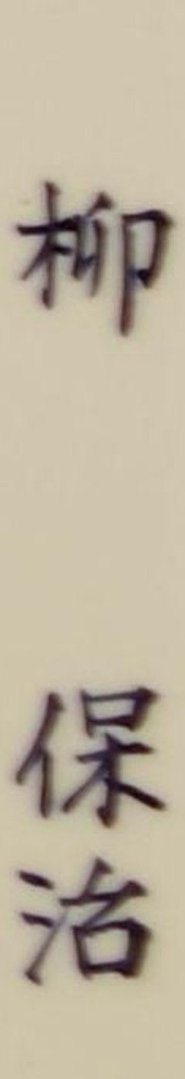柳保治
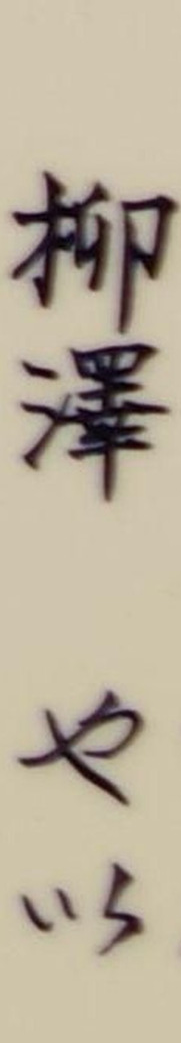柳沢やい
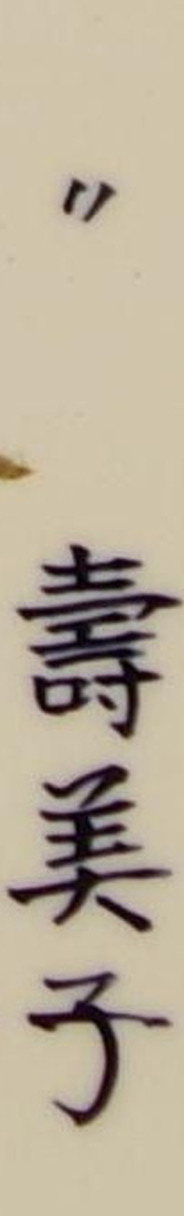壽美子
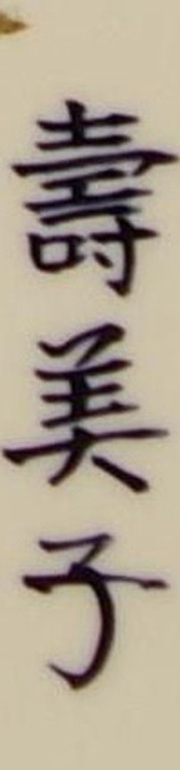壽美子
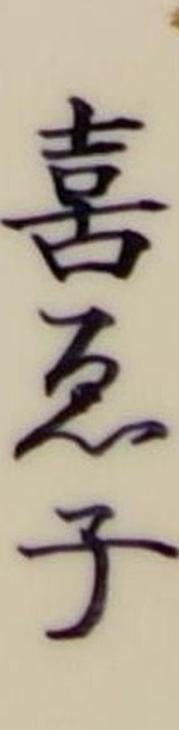喜ゑ子
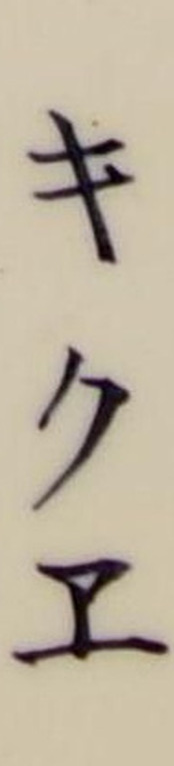キクヱ
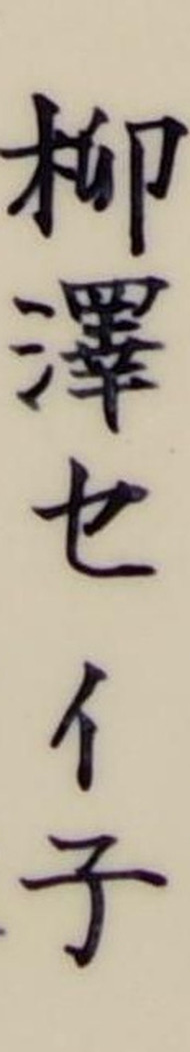柳澤セイ子
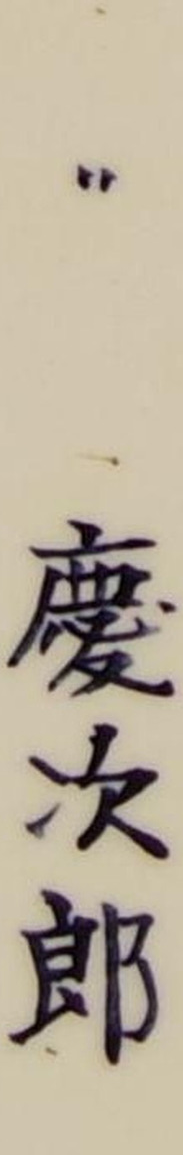慶次郎
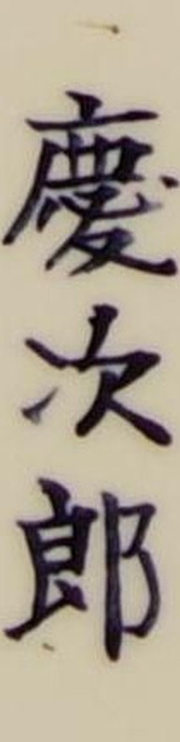慶次郎
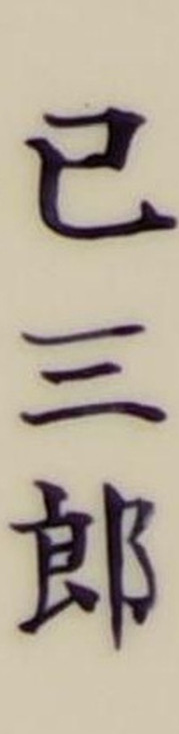巳三郎
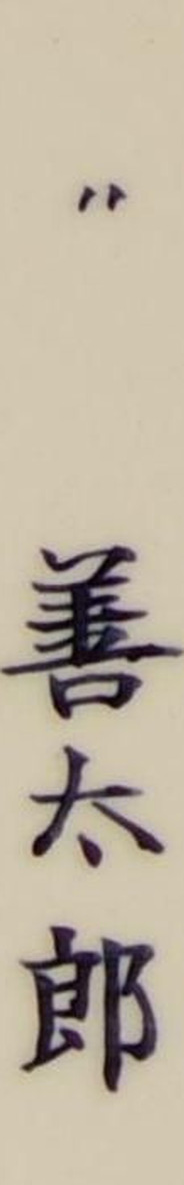善太郎
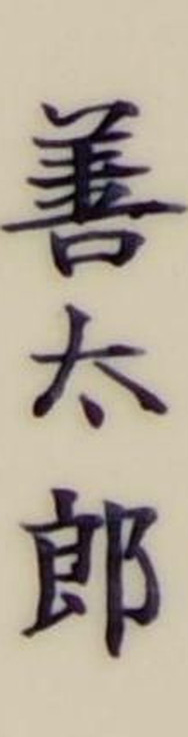善太郎
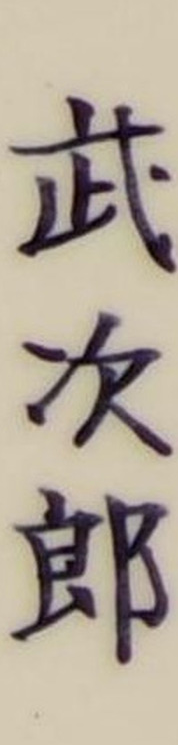武次郎
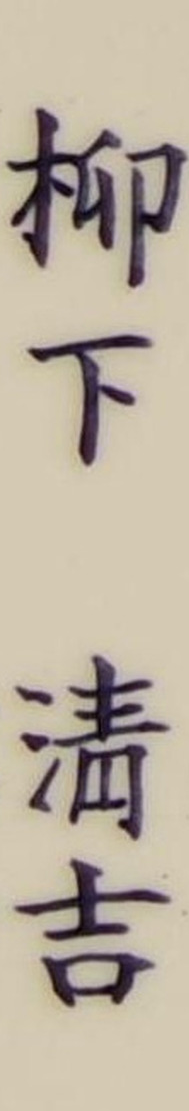柳下清吉
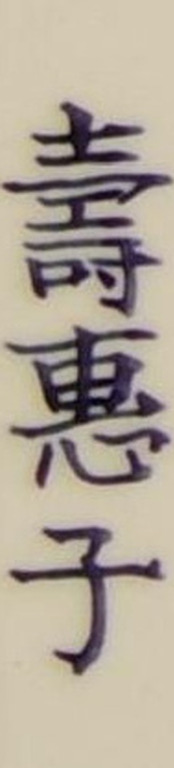壽恵子

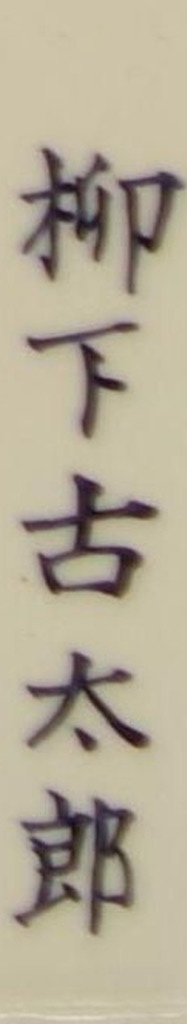柳下古太郎
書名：A~D
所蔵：koyasan kongobuji
